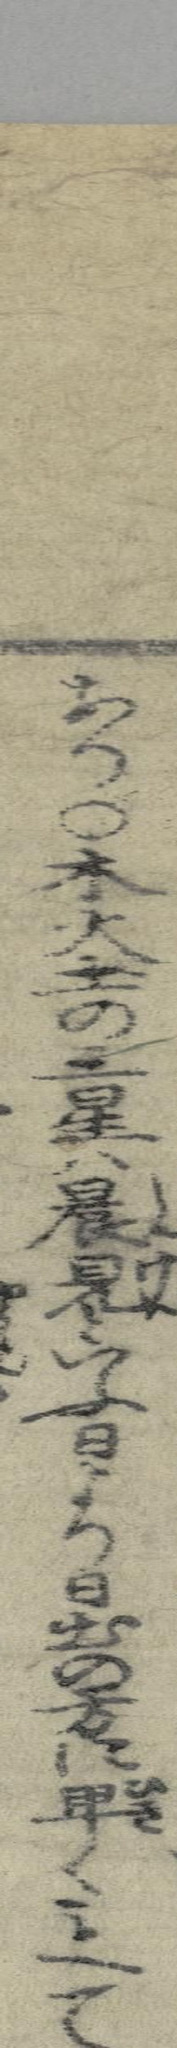あり〇木火土の三星は晨見といふ日より日出の方に卑くみへて
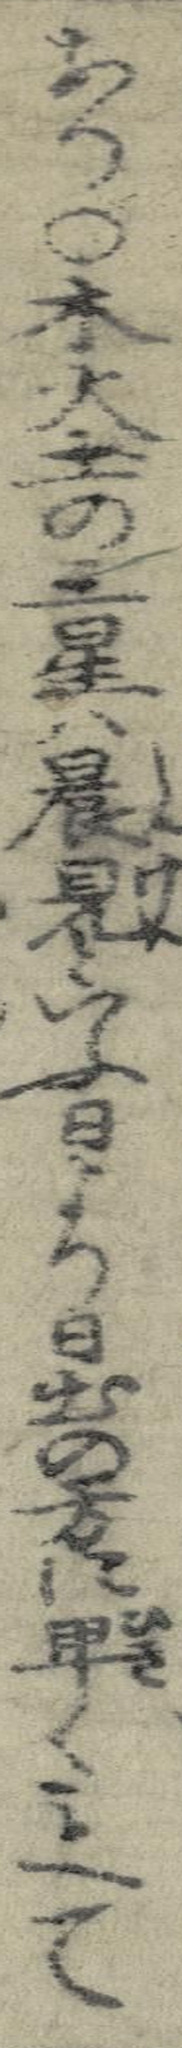あり〇木火土の三星は晨見といふ日より日出の方に卑くみへて
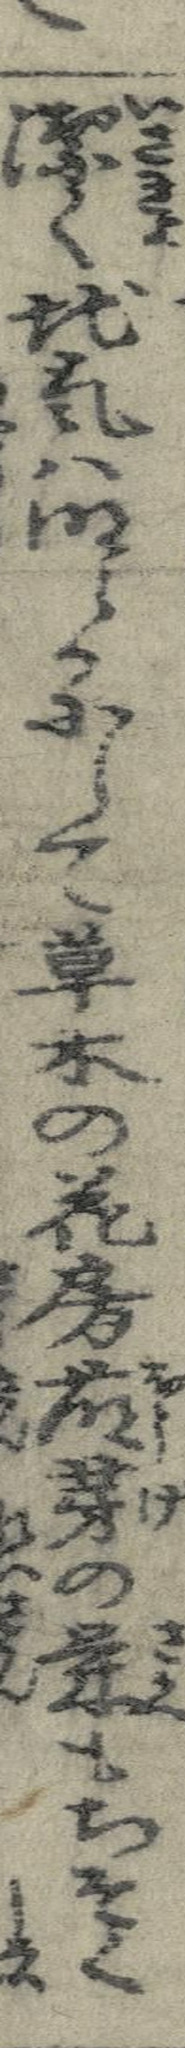潔く地気は明らかにして草木の花房藤芽の栄もちそく
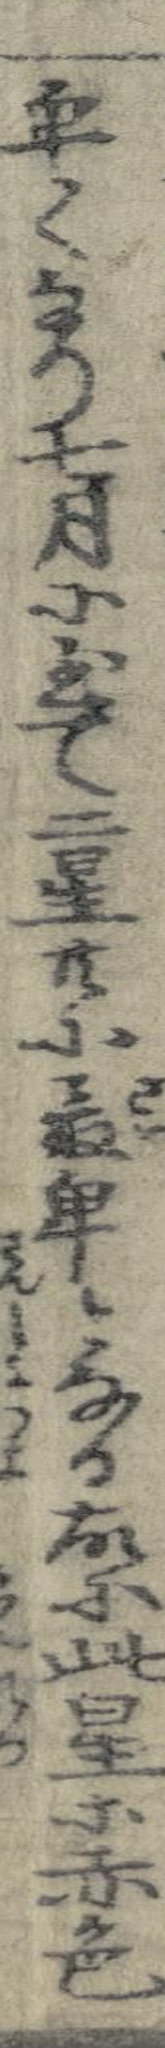卑くなり七月に至てニ星共に最卑となる故に此星等赤色
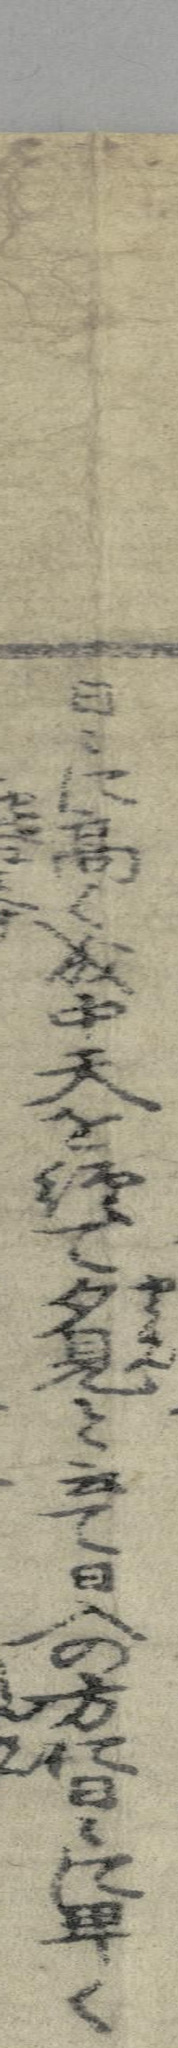日々に高く成中天を経て夕見と云て日入の方に日〻に卑く
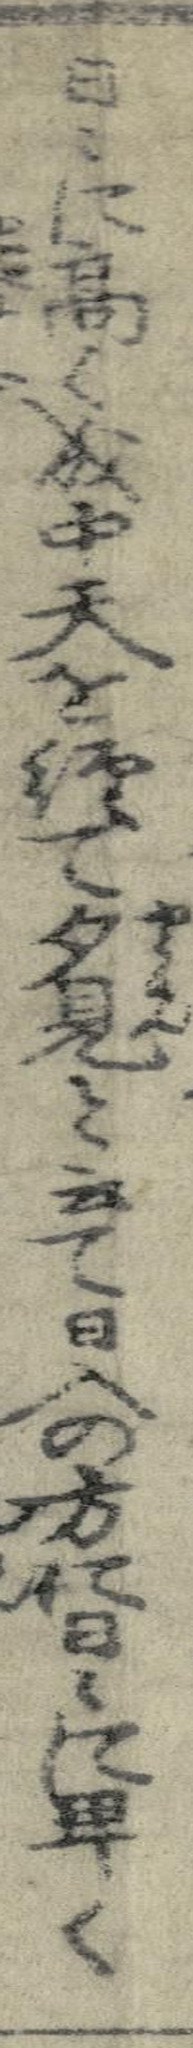日々に高く成中天を経て夕見と云て日入の方に日〻に卑く
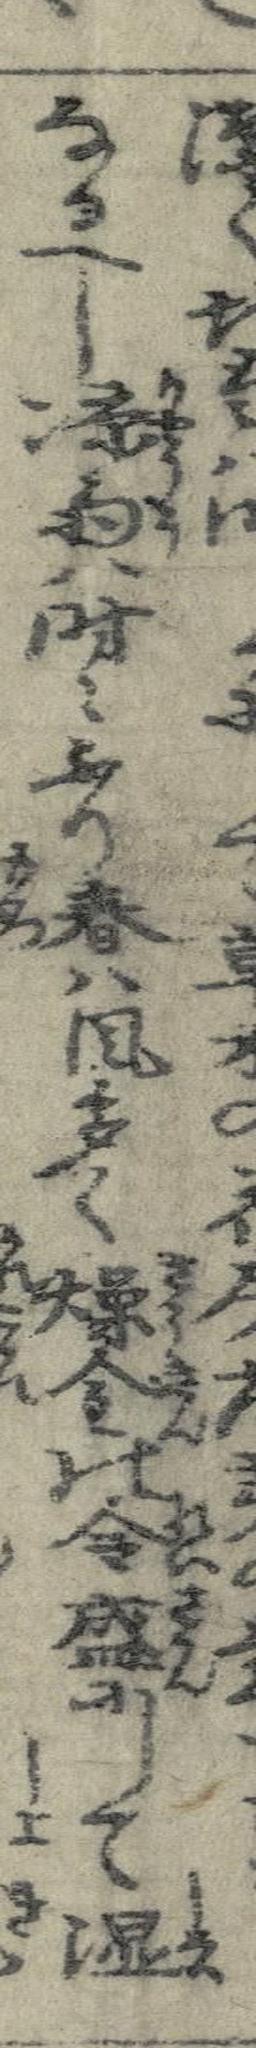なるへし緑雨は時々ふり春は風多く燥金の令盛にして湿
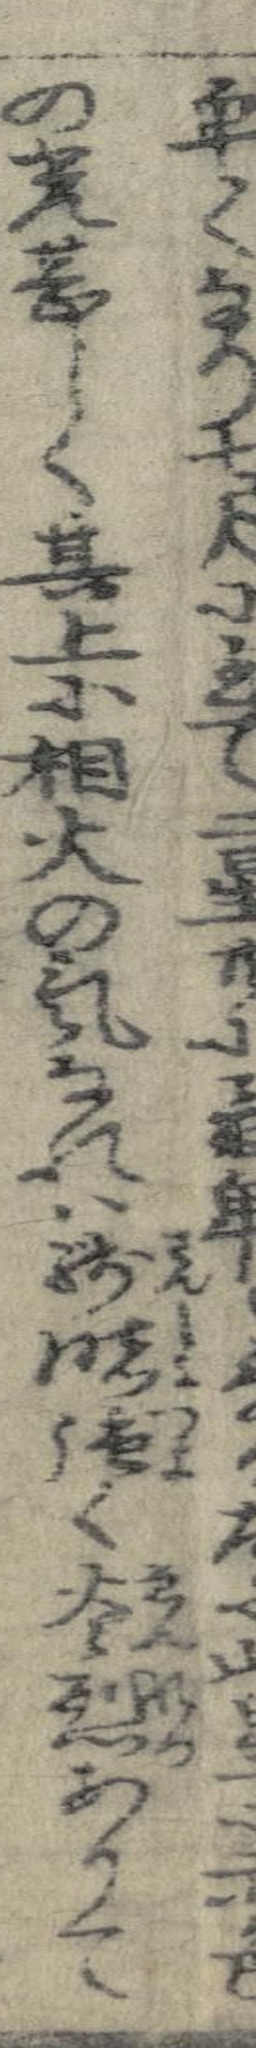の光甚しく其上に相火の気なれは残照強く炎烈ありて
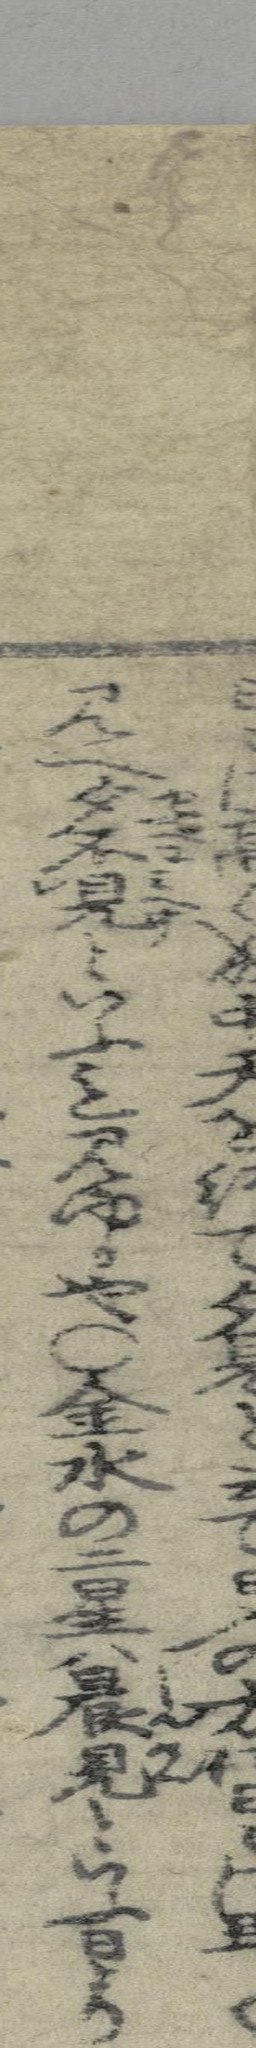見へ夕不見といふ迄見ゆるや〇金水のニ星は晨見しらふ日より
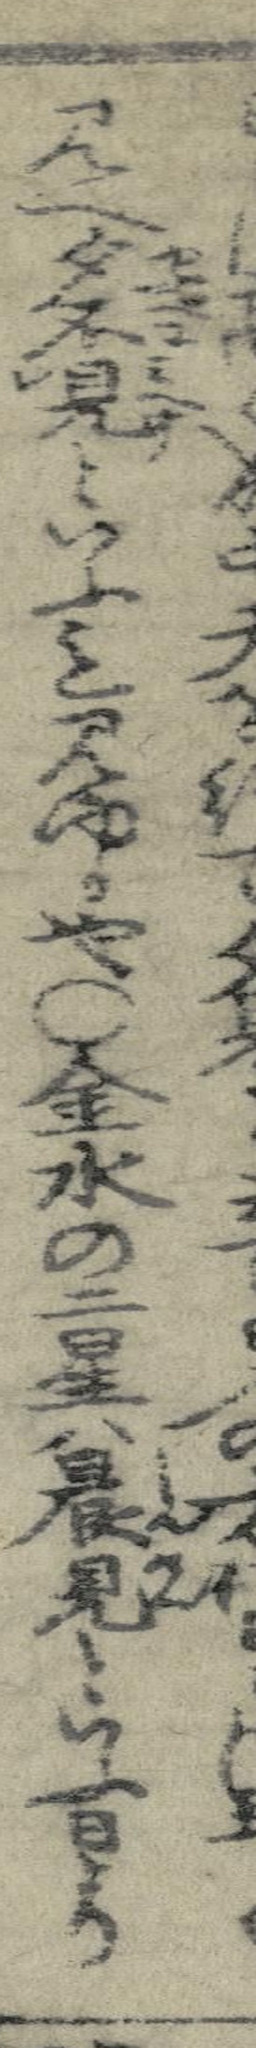見へ夕不見といふ迄見ゆるや〇金水のニ星は晨見しらふ日より
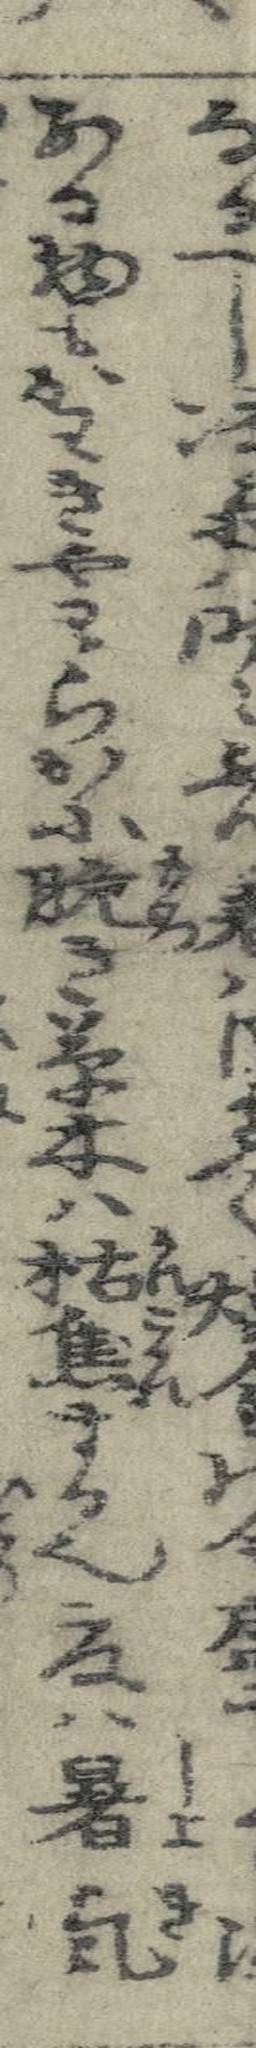ある物もかわきやわらかに脆き草木は枯焦する也度は暑気
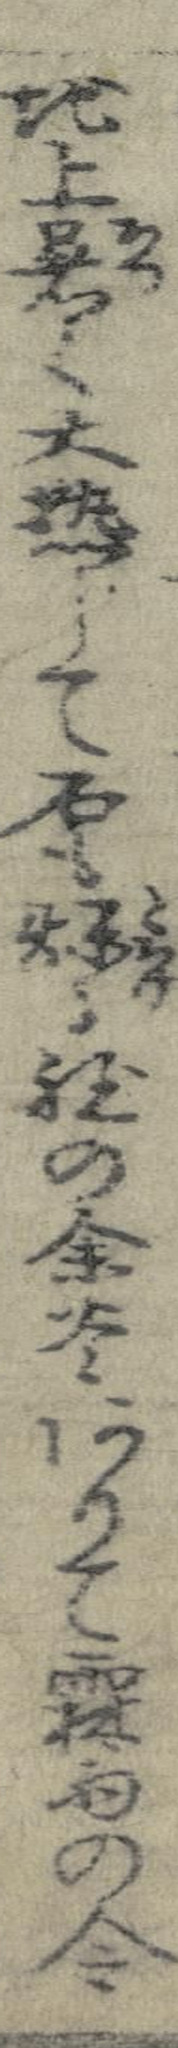地上暑く大熱して石も砕る程の余炎ありて霜雨の令
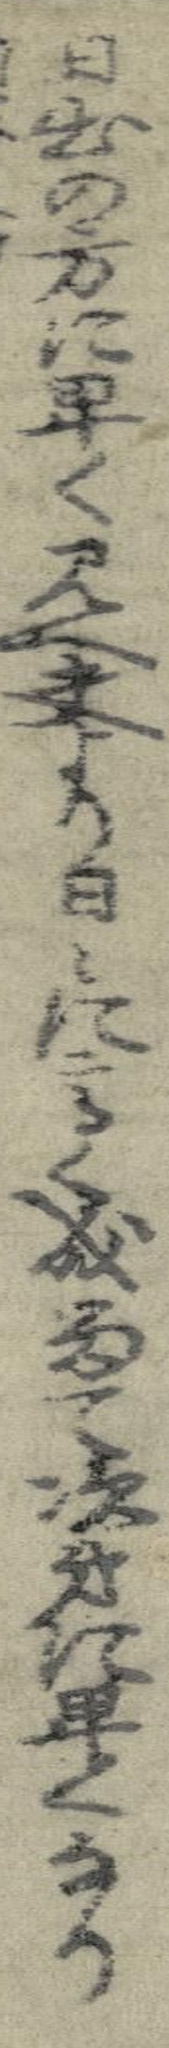日出の方に卑く見へ夫より日〻に高く成るて次第に卑くなり
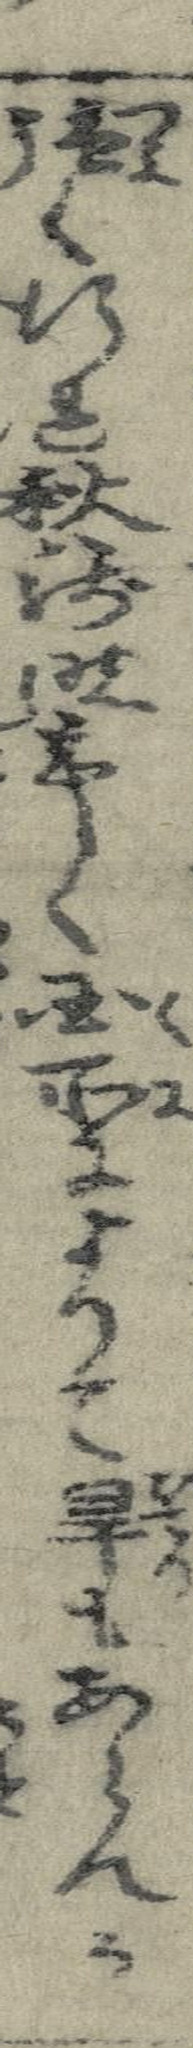強く行れ秋残照甚しく国所によりて旱もあらんか
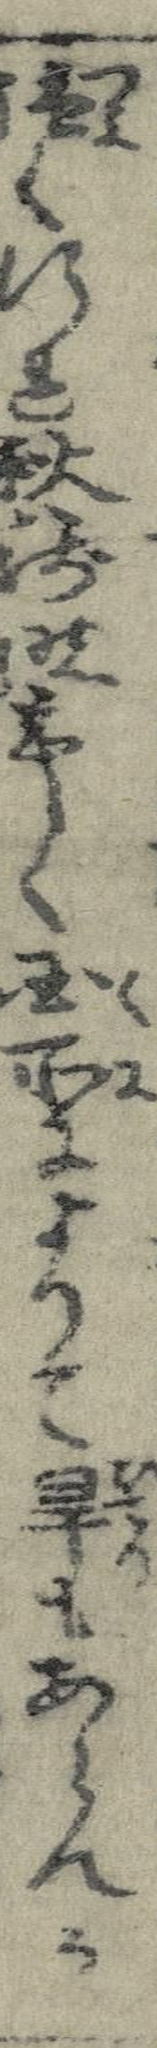強く行れ秋残照甚しく国所によりて旱もあらんか
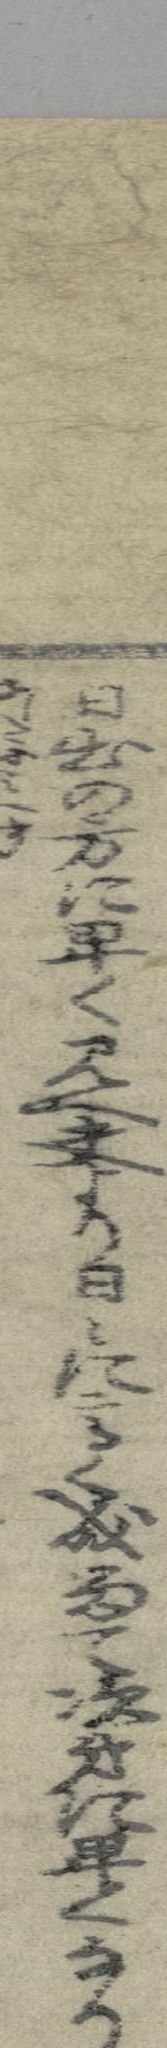日出の方に卑く見へ夫より日〻に高く成るて次第に卑くなり
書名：天保十六年乙巳七曜　晴雨考　土御門殿御免
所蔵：東京大学地震研究所図書室 Earthquake Research Institute Library, The University of Tokyo, JAPAN
